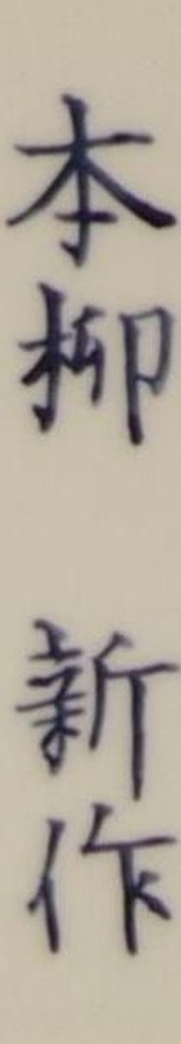本柳新作
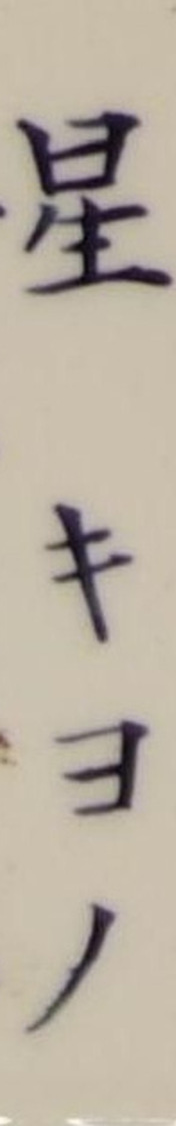星キヨノ
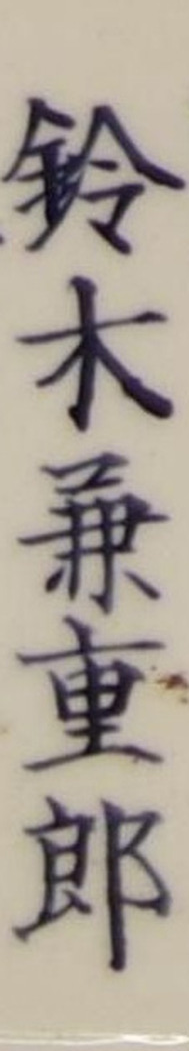鈴木兼重郎
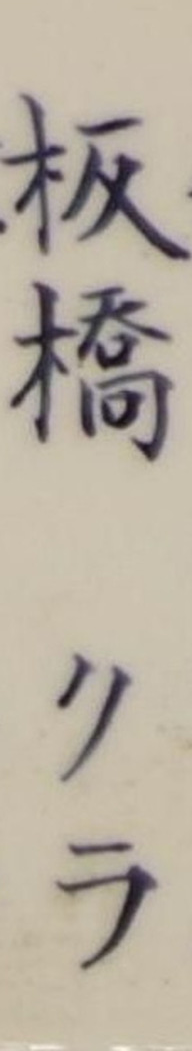板橋クラ
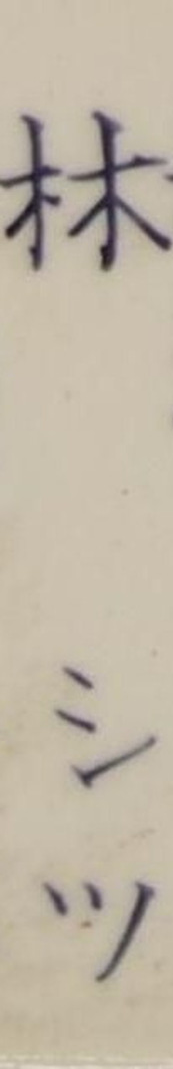林シツ
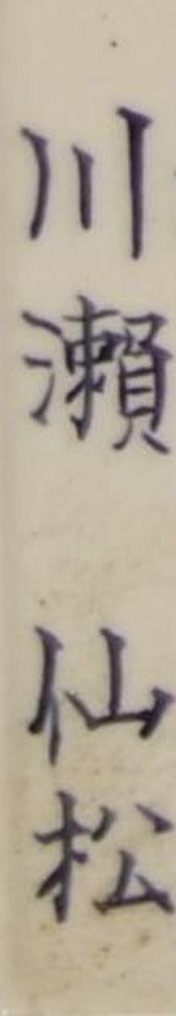川瀬仙松

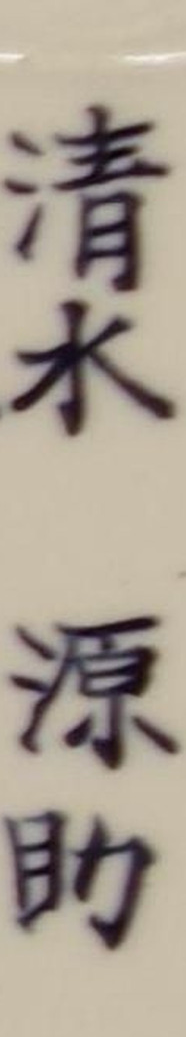清水源助
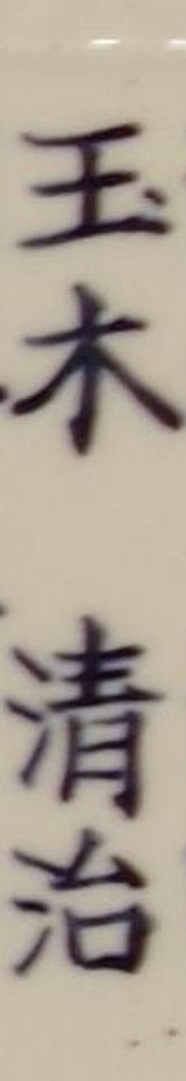玉木清治
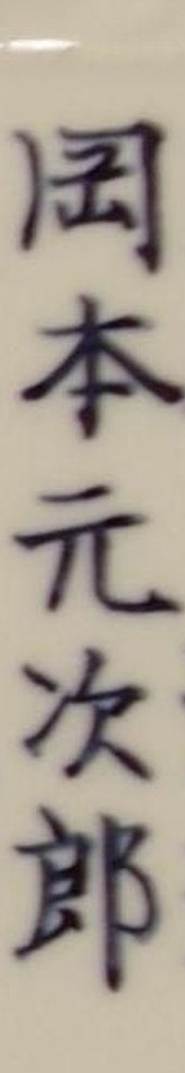岡本元次郎
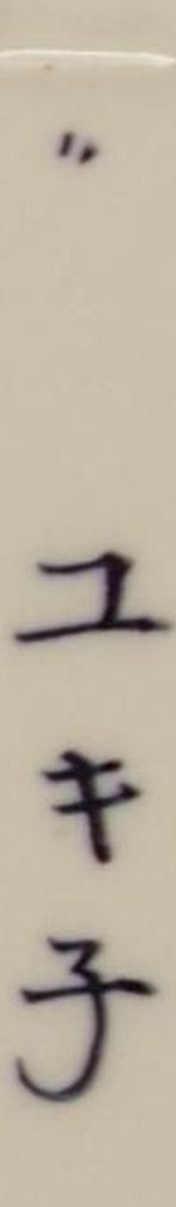ユキ子
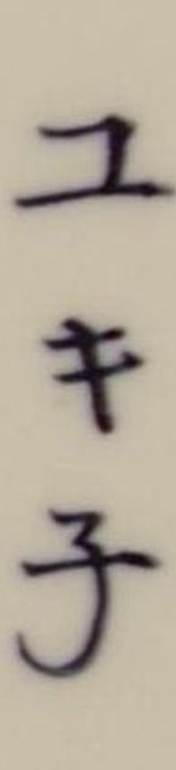ユキ子
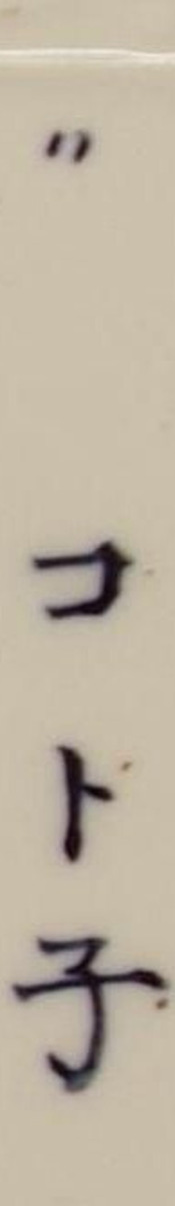コト子
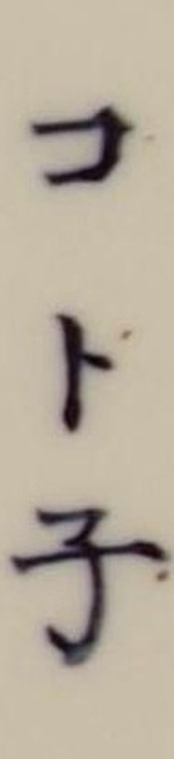コト子
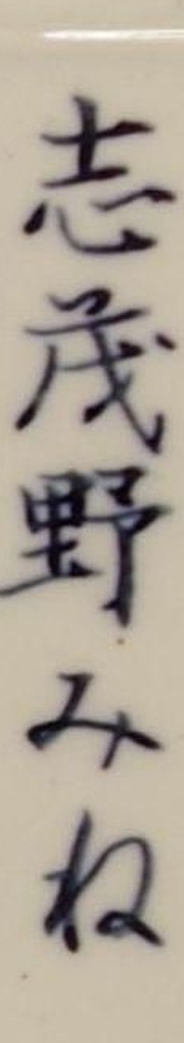志茂野みね
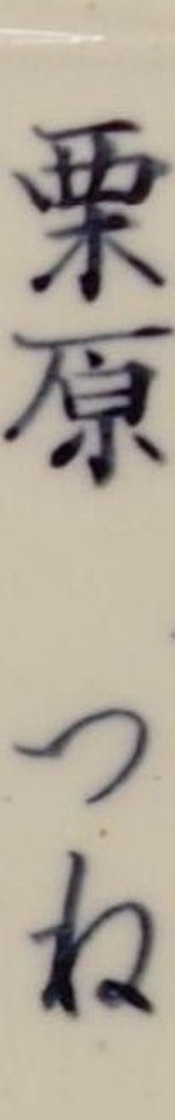栗原つね
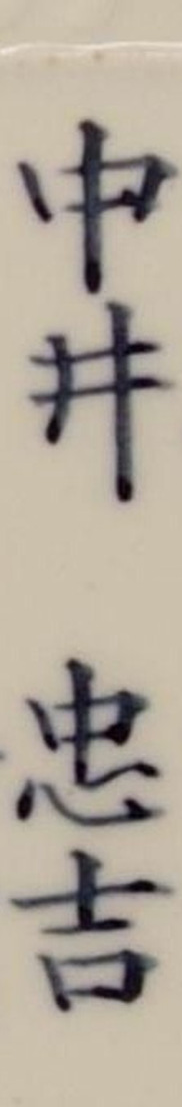中井忠吉
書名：E~L
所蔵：高野山金剛峯寺
